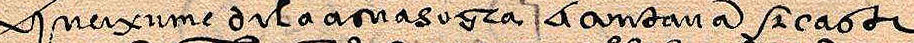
queixume dela a sua sogra acoutauā e casti
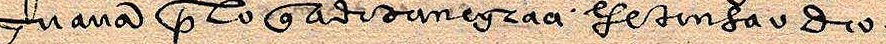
guauā p̄lo q̄ a dita negraa lhe tinha odio.
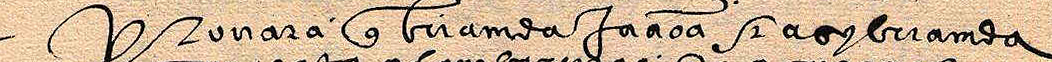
Ꝓrouara q̄ briamda Jaāoa e asy briamda
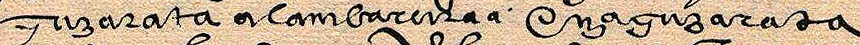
guzarata a lambareiraa e ma guzarata
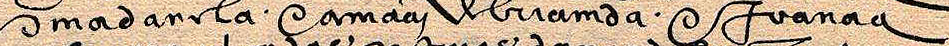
e madanela e a maãj de briamda. e Joanaa
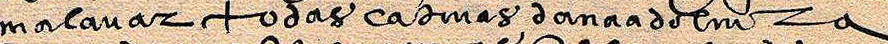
malauar todas catiuas danaa doliura
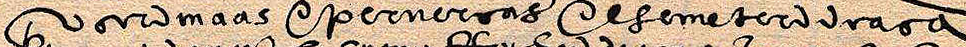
p̄o serē maas e peruersas e lhe meterē ē casa
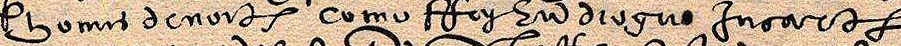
homes de noitꝭ como ffoy hū dioguo Jusartꝭ
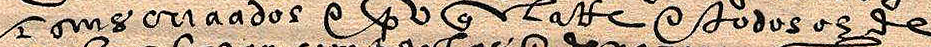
e seus criaados e p̄o q̄ ela Re e todos os de
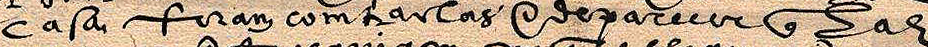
casa foram comtra elas e de parecer q̄ has
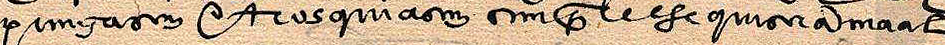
pimgasem e trosquiasem sempre lhe quiserā maal
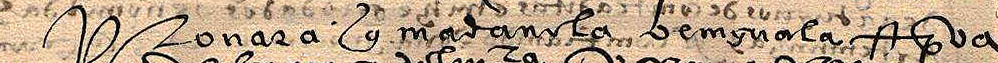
Ꝓrouara q̄ madanela bemguala stp̄va
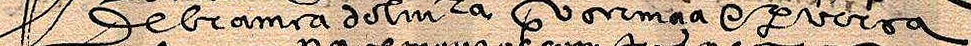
de bramca doliura p̄o ser maa e ꝑversa
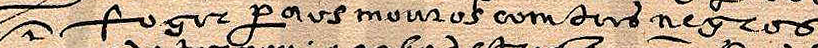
e fogir ꝑa os mouros com tres negros
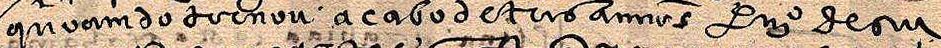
quoamdo tornou a cabo de tres annos ꝑ mo de seu
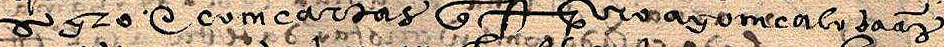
sogro e com cartas q̄ stp̄vio a gomcalo vaāz
